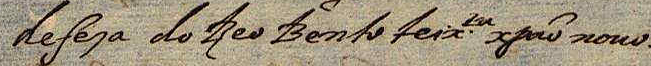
defesa do Reo Bento teixra xpaõ nouo
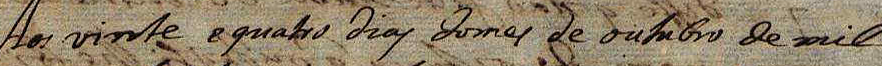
Aos vinte e quatro dias do mes de outubro de mil
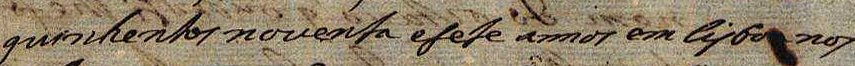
quinhentos nouenta e sete anos em lisboa nos
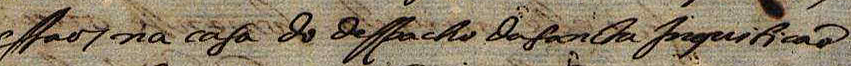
Estaos na casa do despaho da sancta Jnquisicaõ
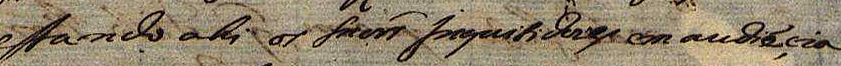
estando ahi os snors̄ Jnquisidores em audiēçia
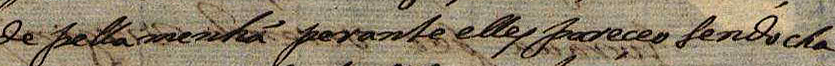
de pella menhā perante elles pareçeo sendo cha
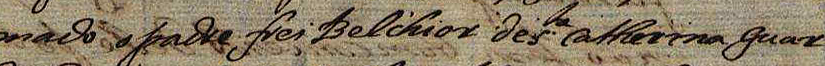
mado o padre frei Belchior de sta catherina Guar
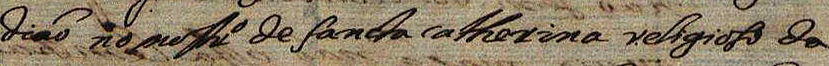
diaõ no mostro de sancta catherina religioso da
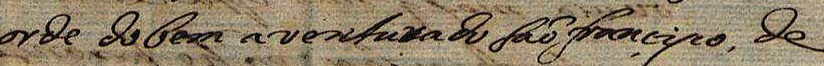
orde do bem aventurado saõ françisco de
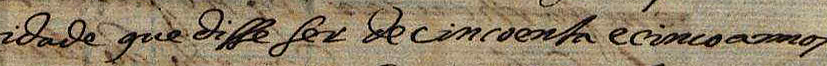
idade que disse ser de cincoenta e cinco annos
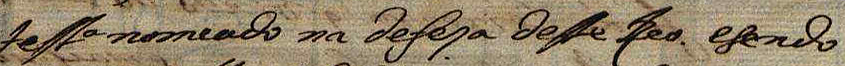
testa nomeado na defeza deste Reo. e sendo
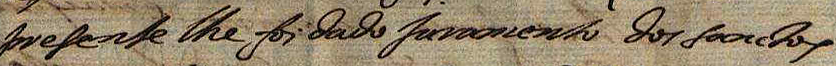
presente lhe foi dado Juramento dos sanctos
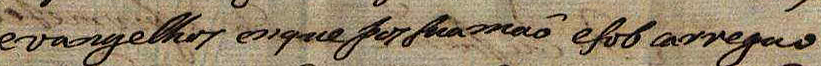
evangelhos em que pos sua maõ e sob carreguo
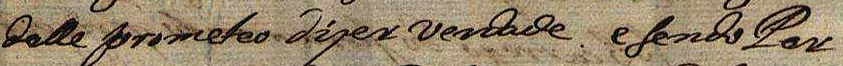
delle prometeo dizer verdade. e sendo Per
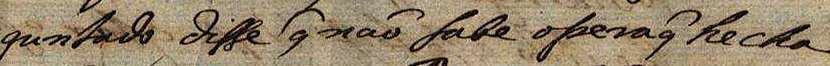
guntado, disse q̄ naõ sabe o pera q̄ he cha
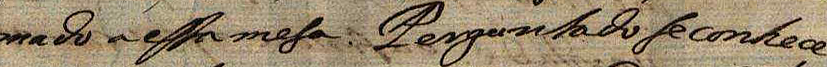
mado a esta mesa. Perguntado se conheçe
